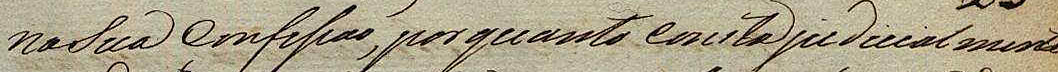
na sua confessaõ, porquanto consta judicialmente
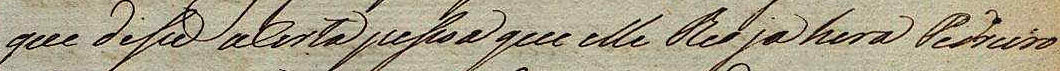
que disse a certa pessoa que elle Reo ja hera Pedreiro
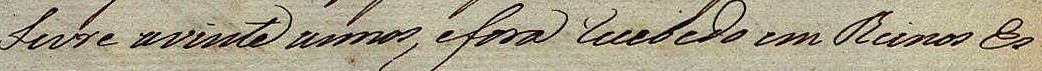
levre a vinte annos, e fora recebedo em Reinos Es
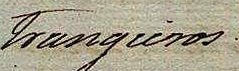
trangeiros.
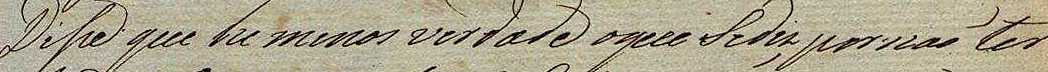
Disse que he menos verdade o que se diz, por naõ ter
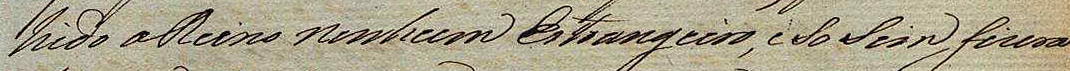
hido a Reino nenhum Estrangeiro, e so sim fizera
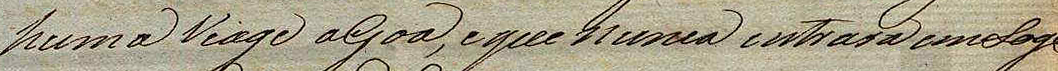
uma Viage a Goa, e que nunca entrara em Loge
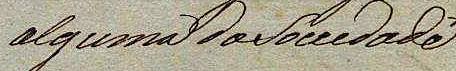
alguma da Sociedade.
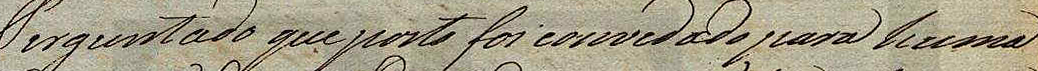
Perguntado que pozto foi convedado para huma
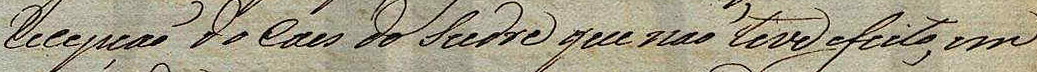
recepçaõ do Caes do Sudre que naõ teve efeito, em
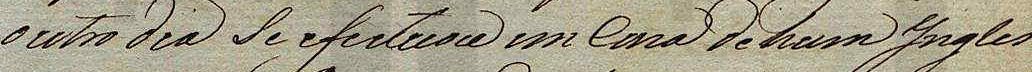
outro dia se efectuou em Caza de hum Ingles
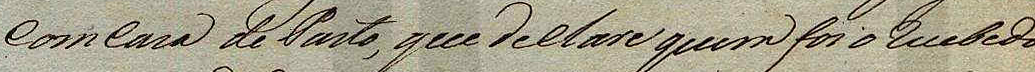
com caza de Pasto, que declare quem foi o recebedo
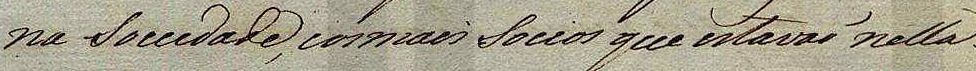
na Soceedade, e os mais socios que estavaõ nella.
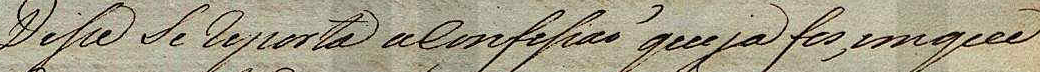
Disse se reporta a confessaõ que ja fes, em que
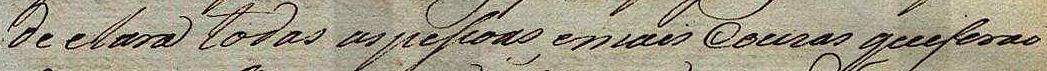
declara todas as pessoas, e mais couzas que foraõ
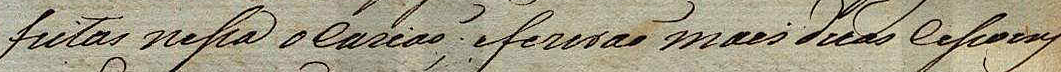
feitas nessa ocaziaõ; e fezeraõ mais duas cessoens
